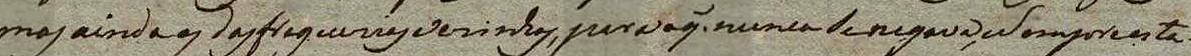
mas ainda os das freguezias vezinhas, para o q̄ nunca se negava, e sempre esta
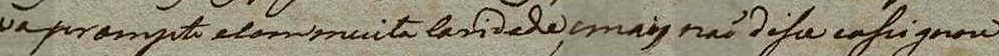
va prompto e com muita caridade, e mais naõ disse e assignou
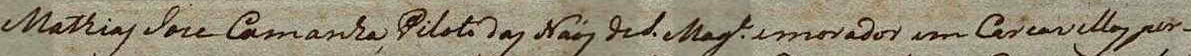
Mathias Ioze Camanha, Piloto das Naós de S. Mag.e e morador em Carcavellos per
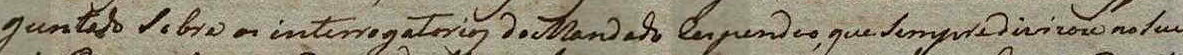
guntado sobre os interrogatorios do Mandado Respondeo, que sempre divizou no seu
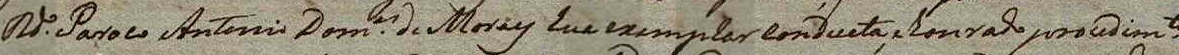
Rd.o Paroco Antonio Dom.es de Moraes hua exemplar conducta, e honrado procedim.to
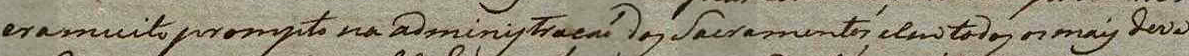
era muito prompto na administraçaõ dos Sacramentos, e em todos os mais deve
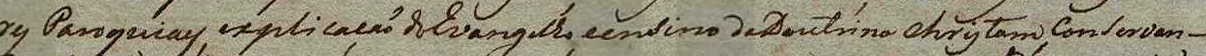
res Paroquiais, explicaçaõ do Evangelho, e ensino da Doutrina christam, conservan
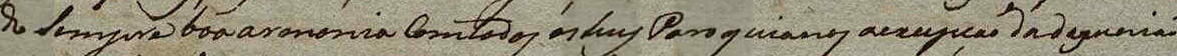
do Sempre boa armonia Com todos os seus Paroquianos a excepcçaõ da desuniaõ
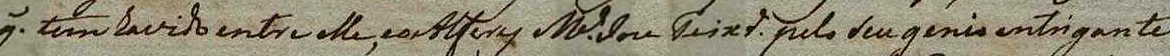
q̄ tem havido entre elle, e o Alferes M.el Ioze Teixr.a pelo seu genio intrigante
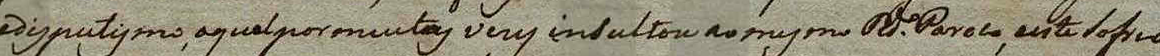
e disputismo, a qual por muitas vezes insultou ao mesmo R.do Paroco, e este sofreo
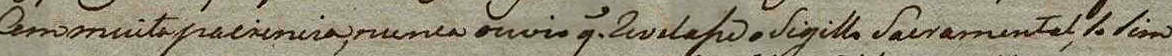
Com muita paciencia, nunca ouvio q̄ Revelasse o sigillo Sacramental, so sim
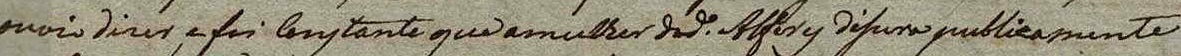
ouvio dizer, e foi Constante que a mulher do d.o Alferes dissera publicamente
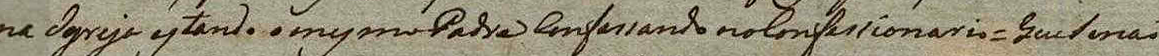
na Igreja estando o mesmo Padre Confessando no Confessionario = Que senaõ
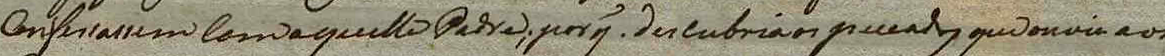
Confessassem Com aquelle Padre, porq̄ descubria os peccados que ouvia aos
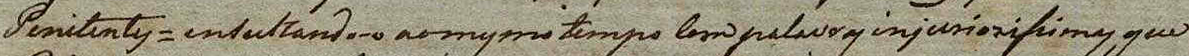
Penitentes = Insultando-o ao mesmo tempo Com palavras injuriozissimas, que
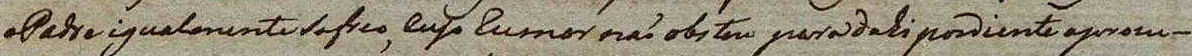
o Padre igualmente sofreo, cujo Rumor naõ obstou para dahi por diante o procu
